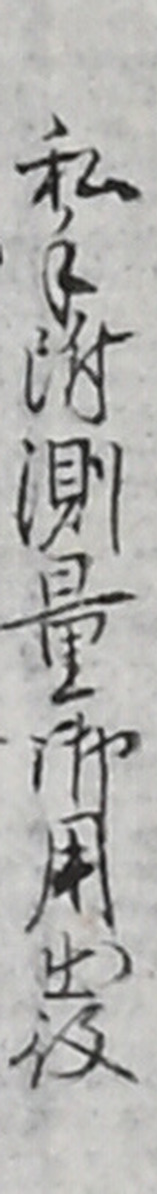私手附測量御用出役
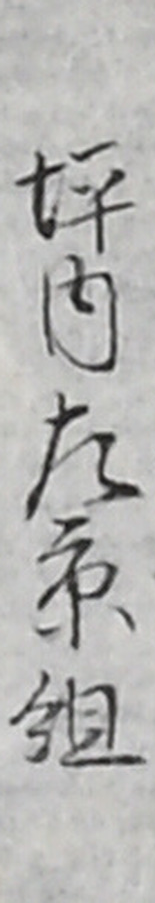坪内左京組
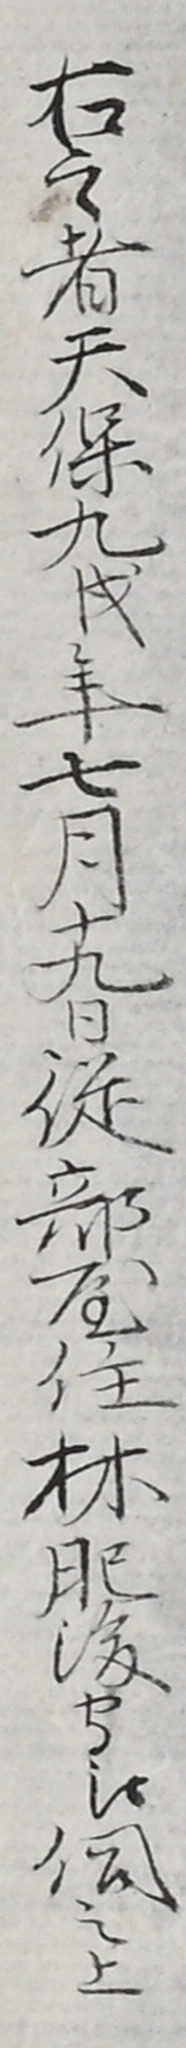右之者天保九戌年七月十九日従部屋住林肥後守え伺之上
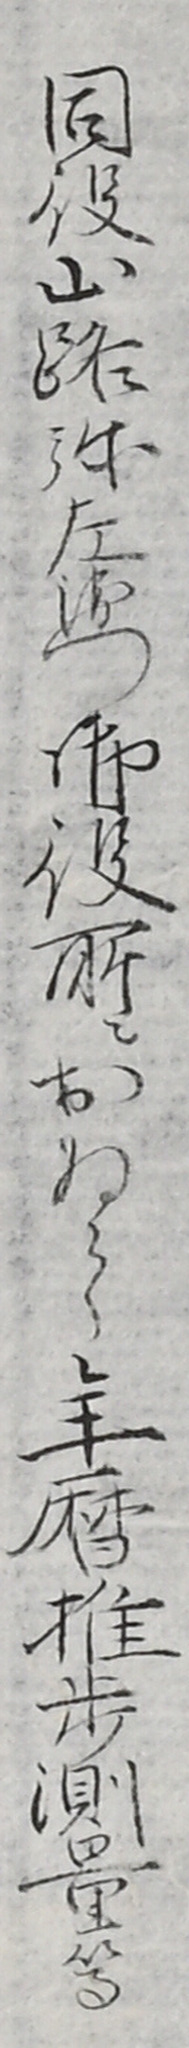同役山路弥左衛門御役所におゐて年暦推歩測量等
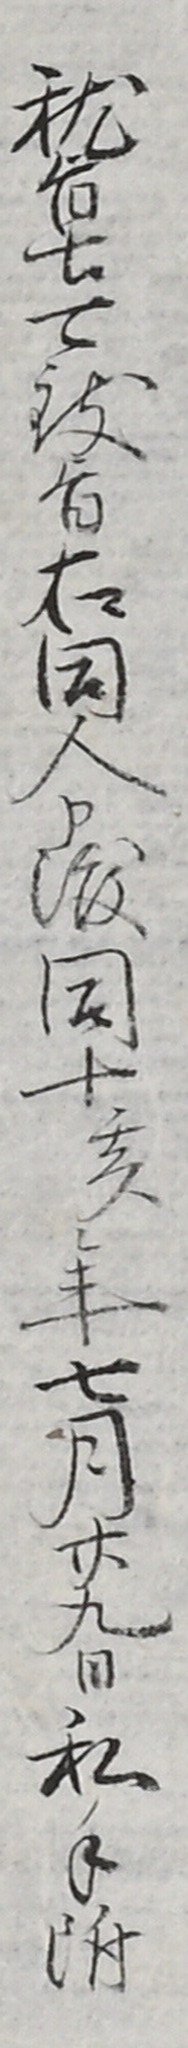稽古可致旨右同人申渡同十亥年七月廿九日私手附
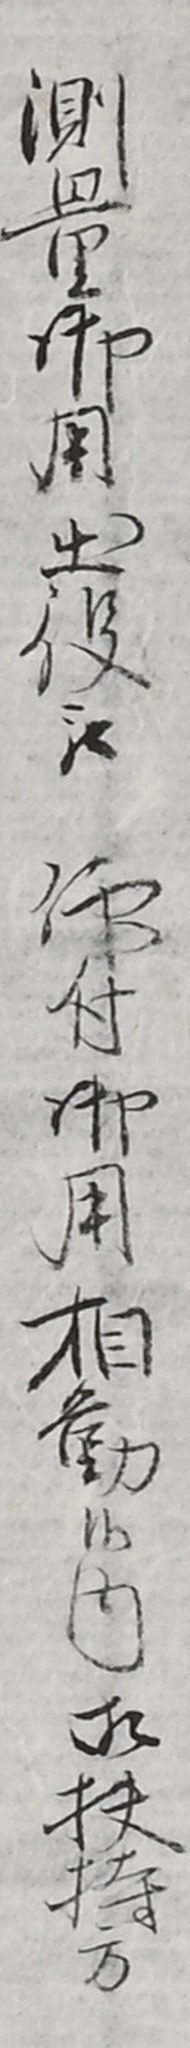測量御用出役被仰付御用相勤候内御扶持方
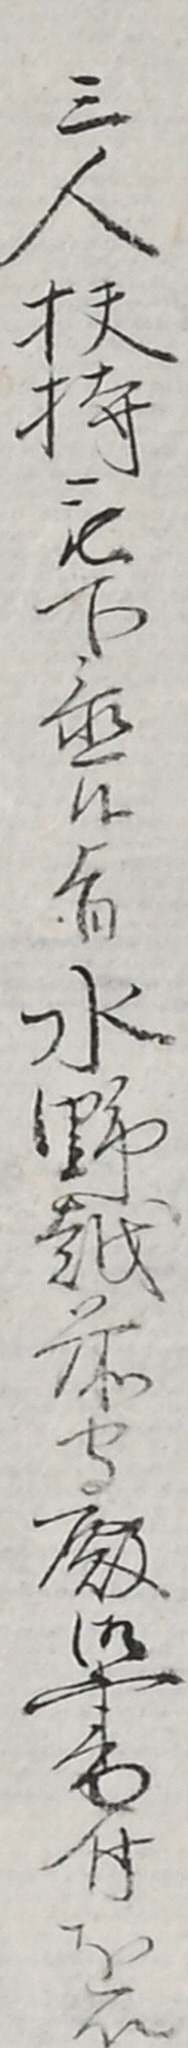三人扶持被下置候旨水野越前守殿御書付を以
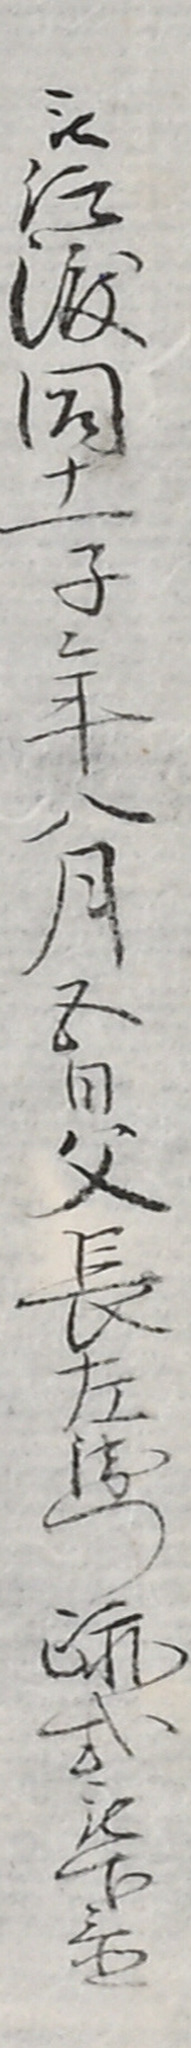被仰渡同十一子年八月五日父長左衛門跡式被下置
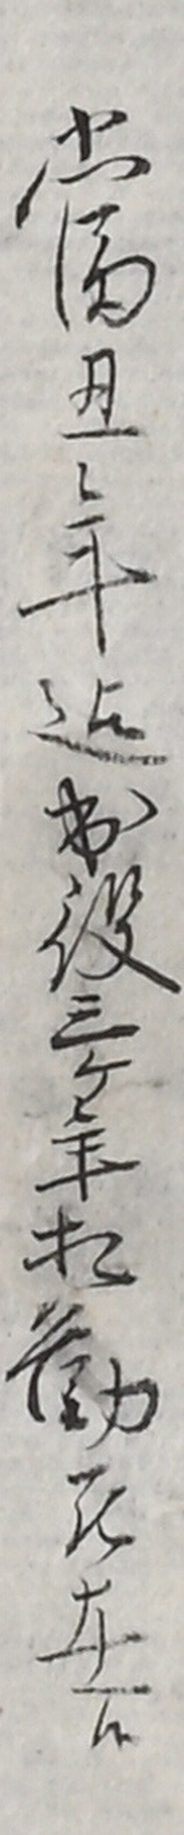当丑年迄出役三ヶ年相勤罷在候
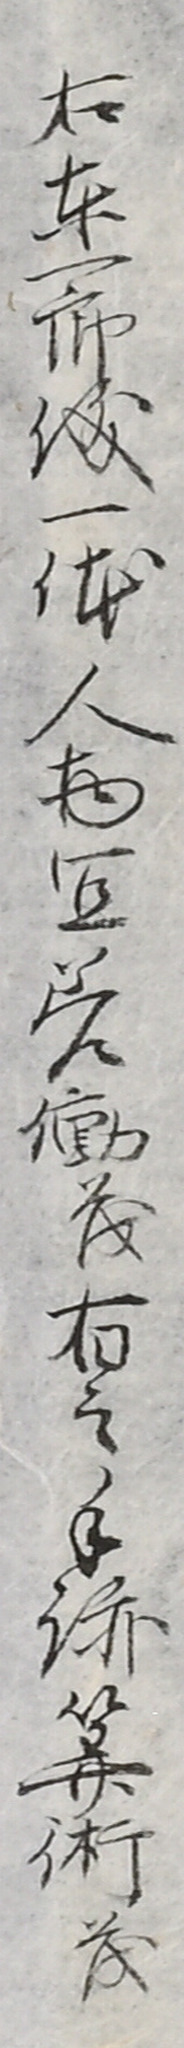右東一郎儀一体人物宜差働も有之手跡算術も
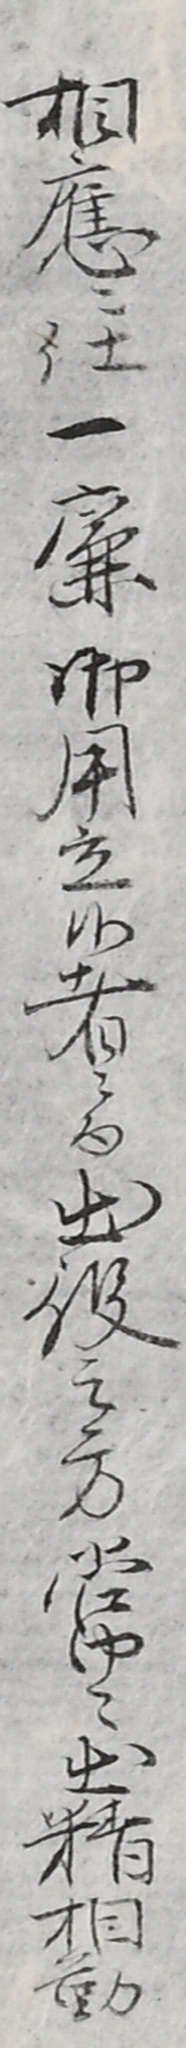相応に仕一廉御用立候者にて出役之方常々出精相勤
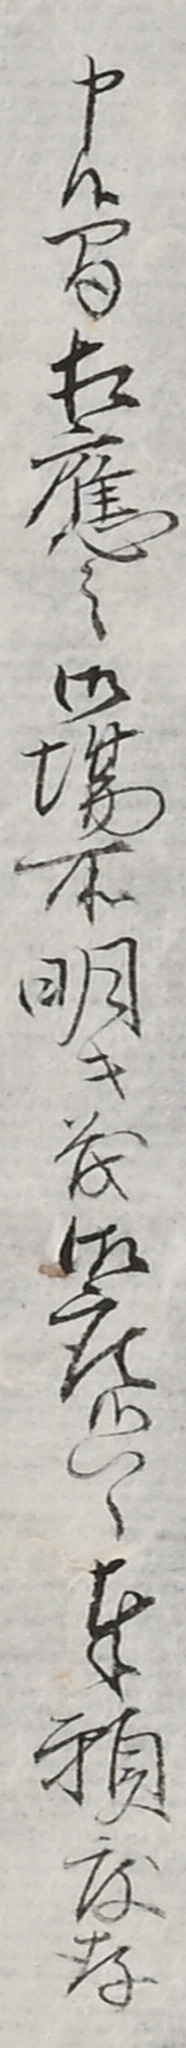申候間相応之御場所明キも御座候はゝ奉願度存
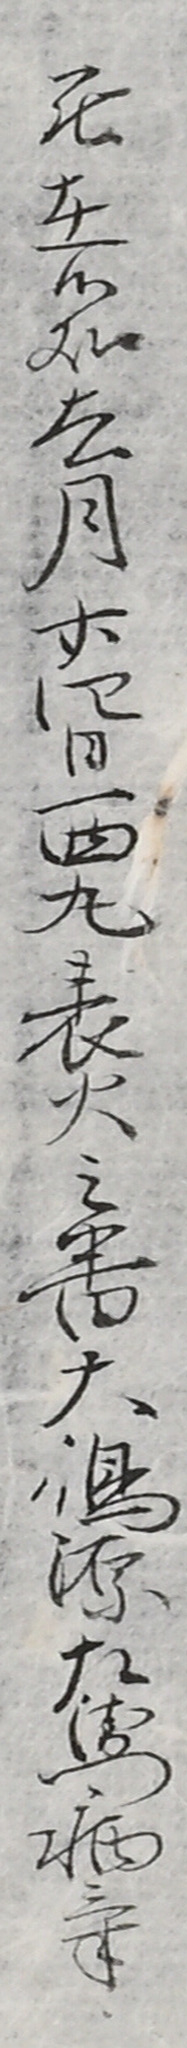罷在候処去月廿四日西丸表火之番大島源左衛門病気
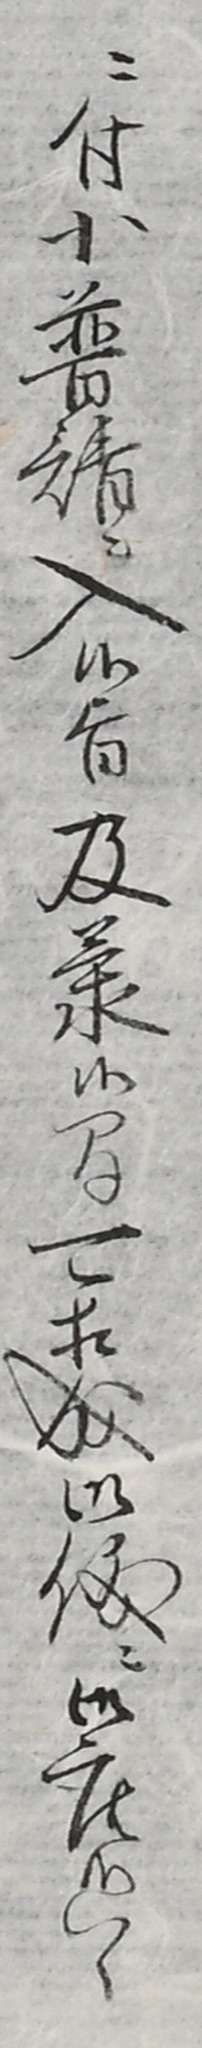に付小普請に入候旨及承候間可相成御儀に御座候はゝ
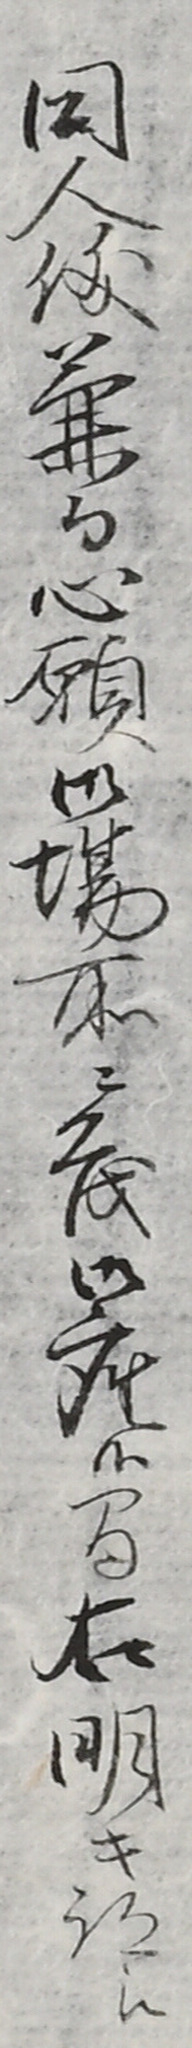同人儀兼て心願御場所にも御座候間右明キ跡え
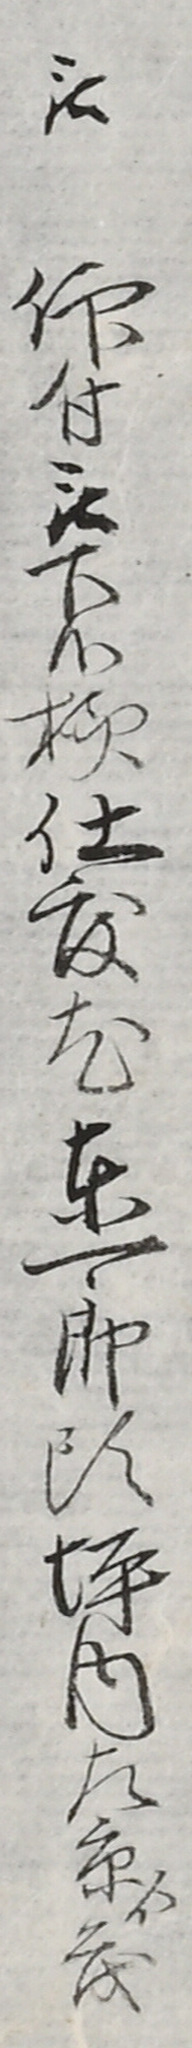被仰付被下候様仕度尤東一郎頭坪内左京ゟも
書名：私手附西村東一郎儀ニ付奉願候書付
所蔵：伊那市立高遠町図書館・合同会社AMANE
